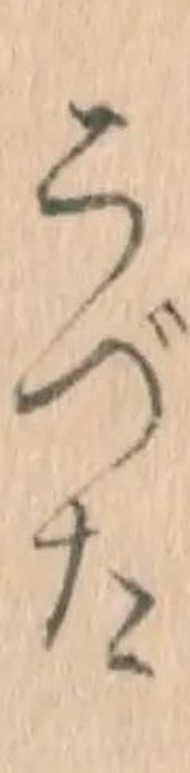こづた
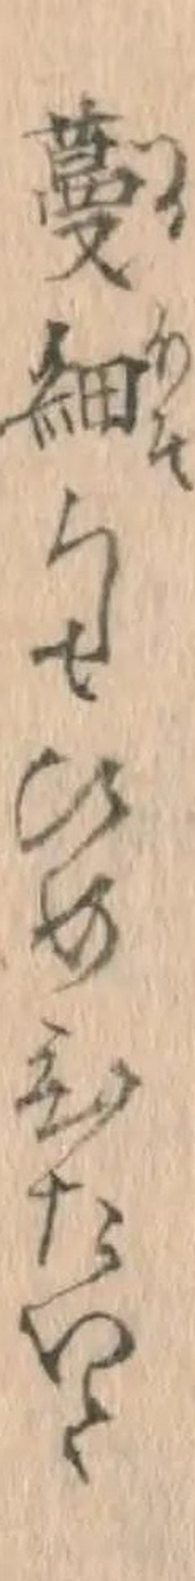蔓細くしてひめひたいと
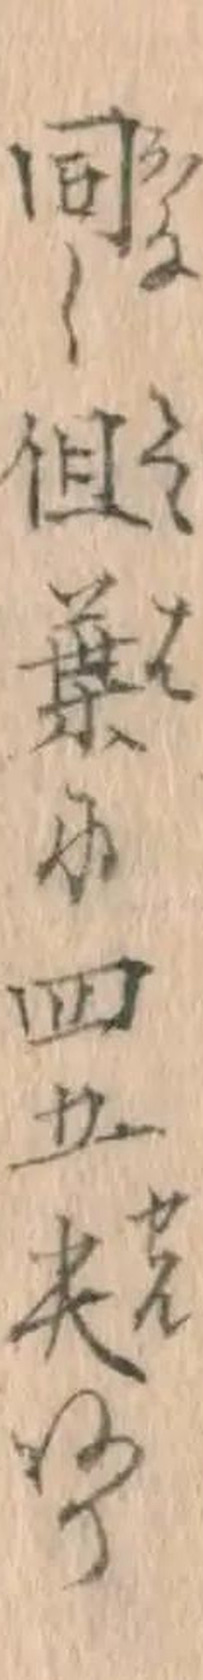同し但葉に四五尖あり
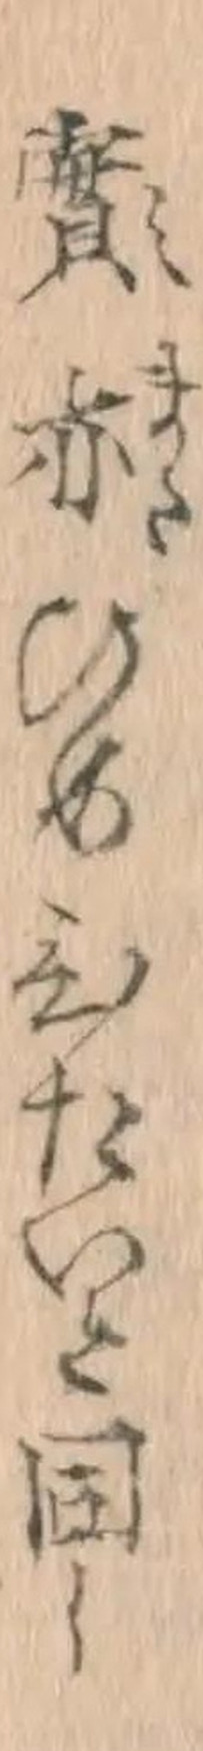実亦ひめひたいと同し
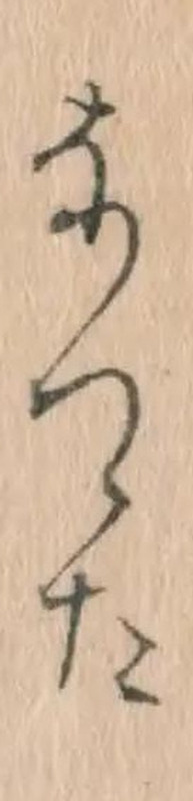なつゝた
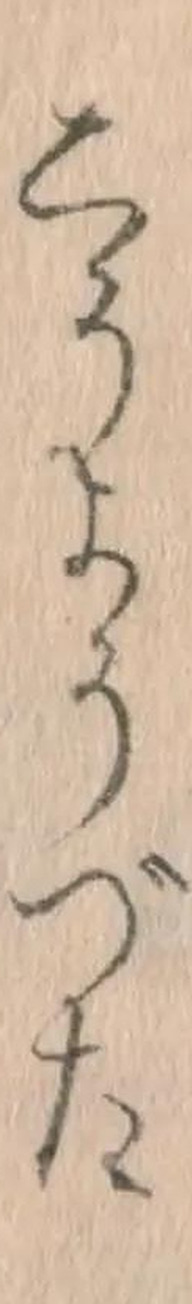こうようづた

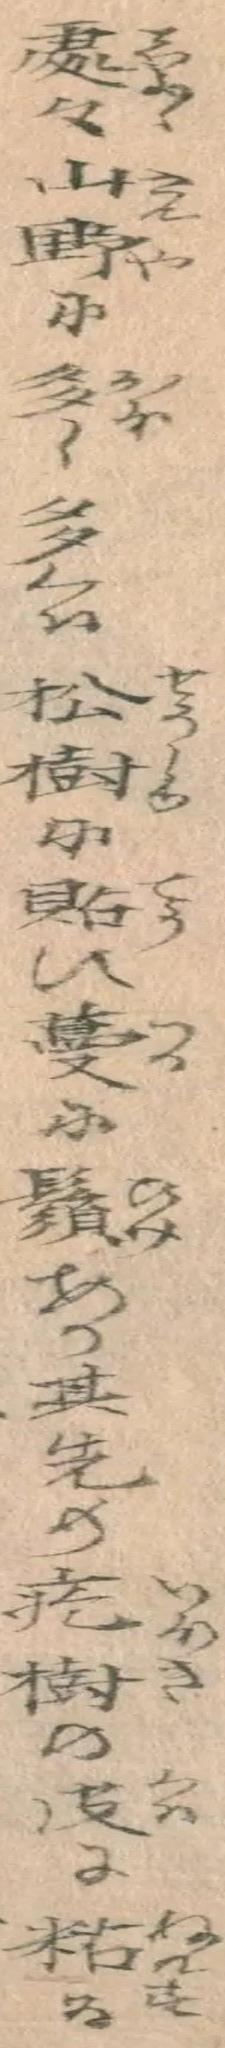処々山野に多し多くは松樹に貼す蔓に鬚あり其先の疣樹の皮に粘る
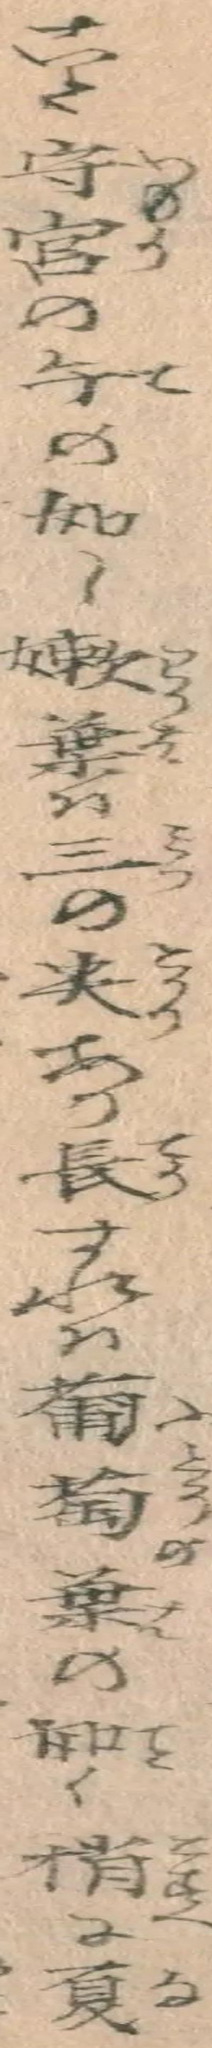こと守宮の手の如し嫩葉は三の尖あり長すれは葡萄葉の如く梢に夏
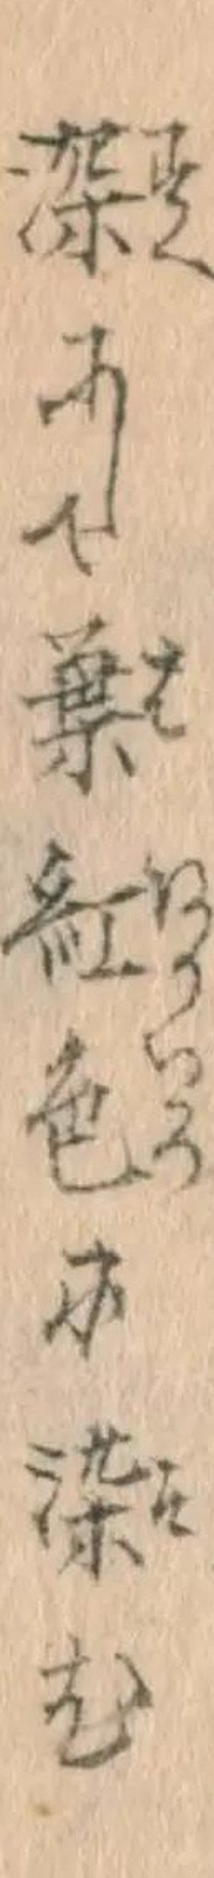深にして葉紅色に染む
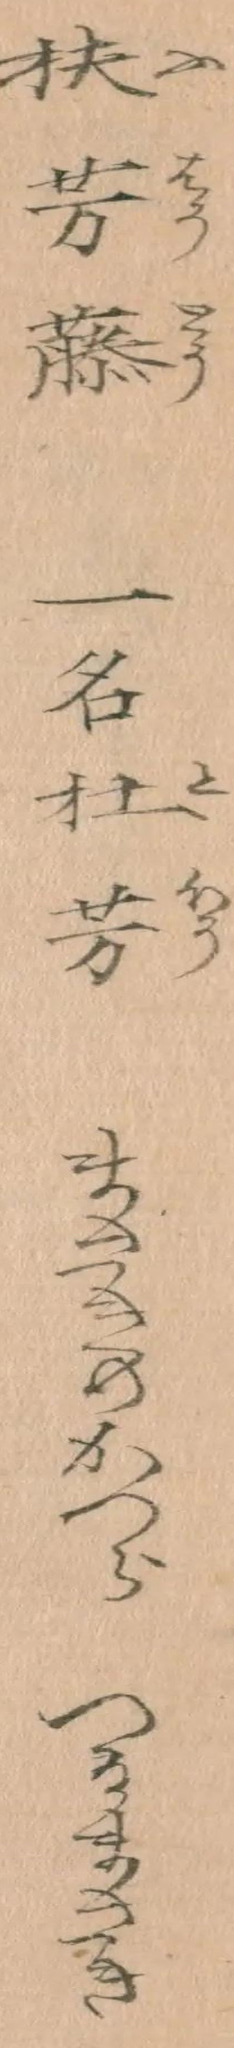扶芳藤一名杜芳まさきのかつらつるまさき
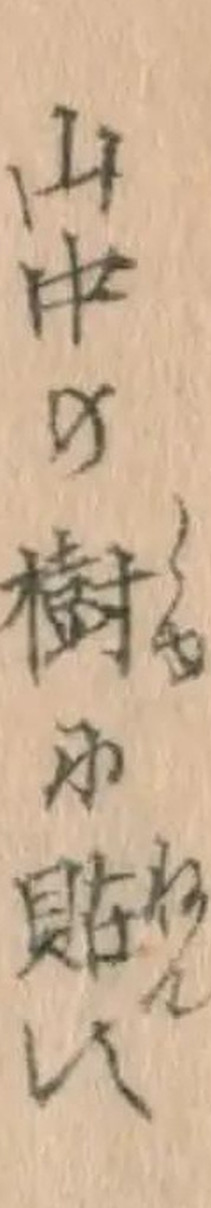山中の樹に貼す
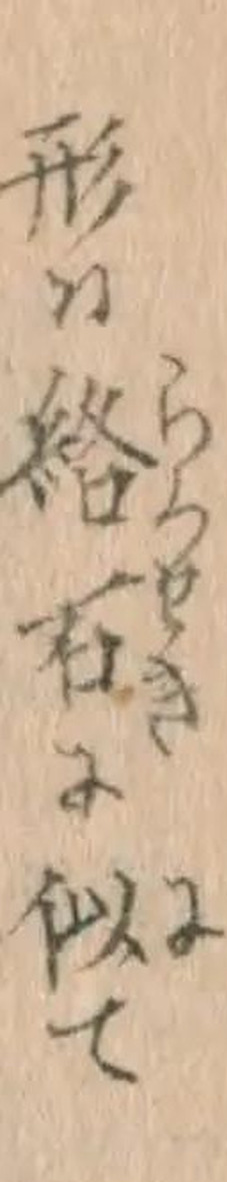形は絡石に似て
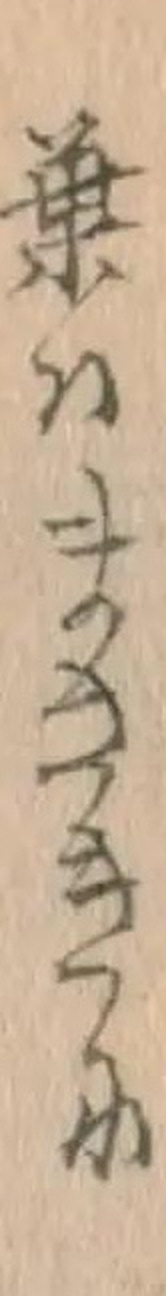葉はまさきに
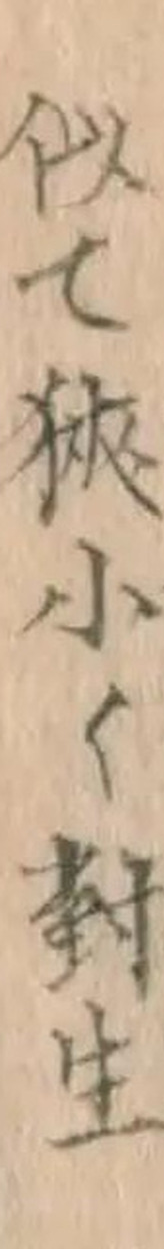似て狭小く対生

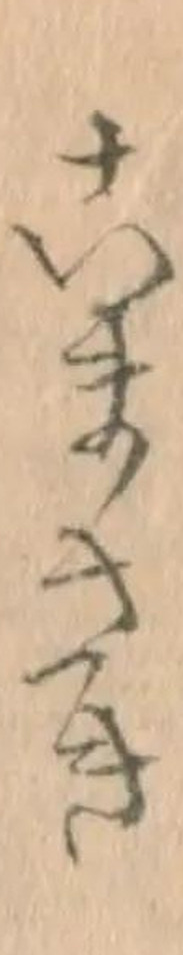こまさき
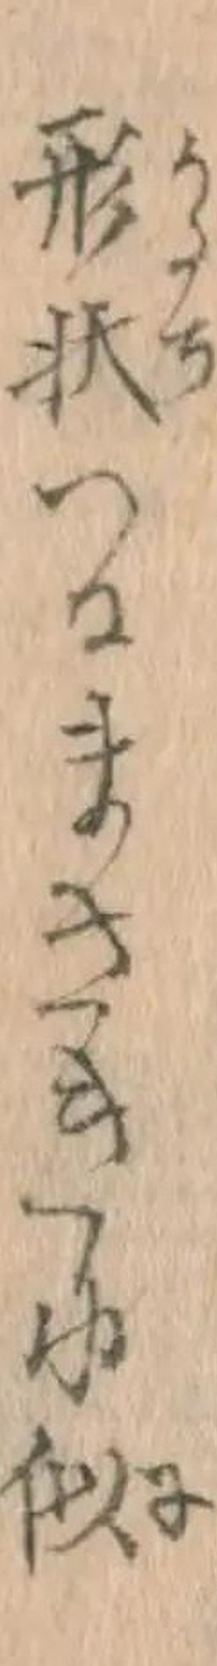形状つるまさきに似
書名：本草図譜. 巻31-33
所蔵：国立国会図書館 National Diet Library, JAPAN
